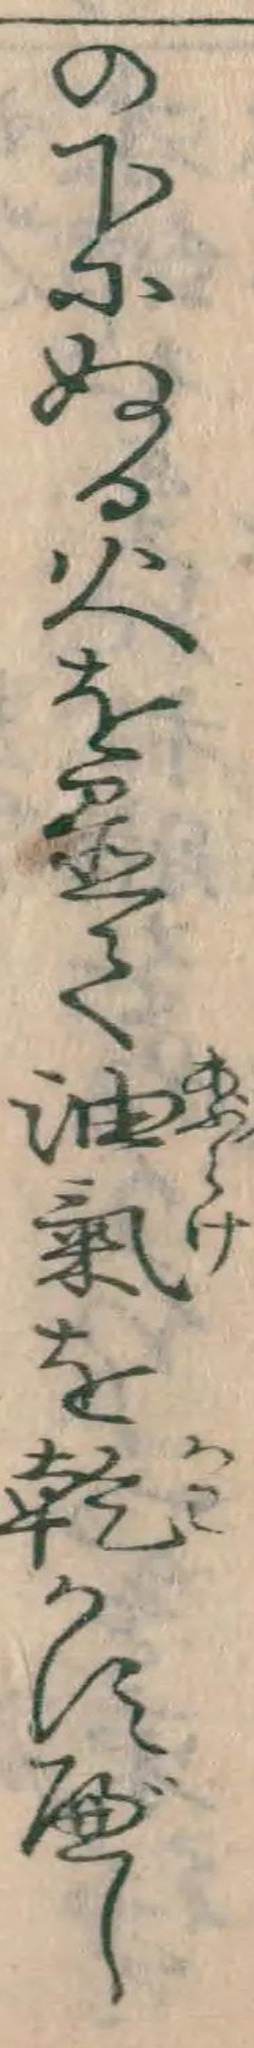の下にぬる火を置て油気を乾かすべし
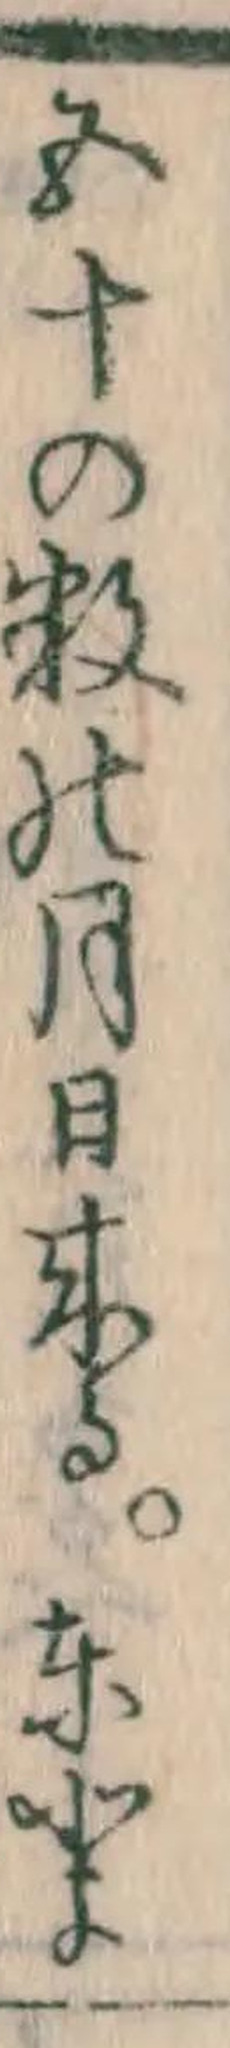五十の数の月日来る。東北よ
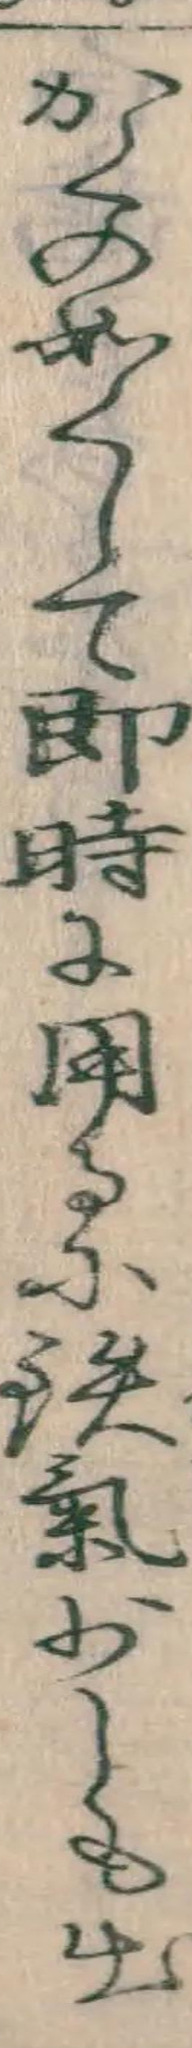かくの如くして即時に用るに鉄気少しも出
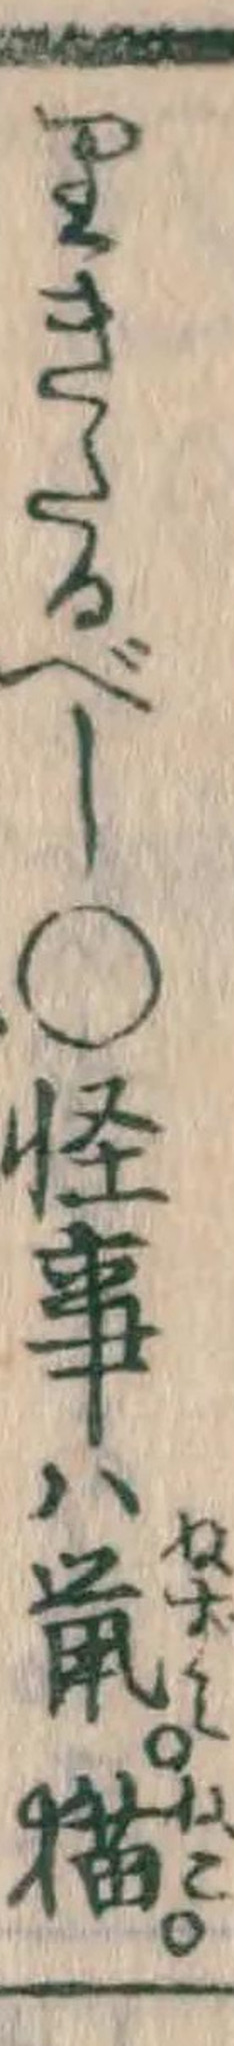りきたるべし○怪事は鼠。猫。
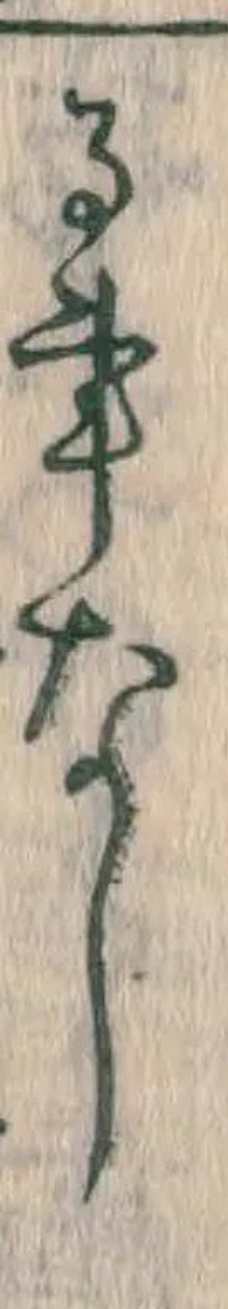る事なし
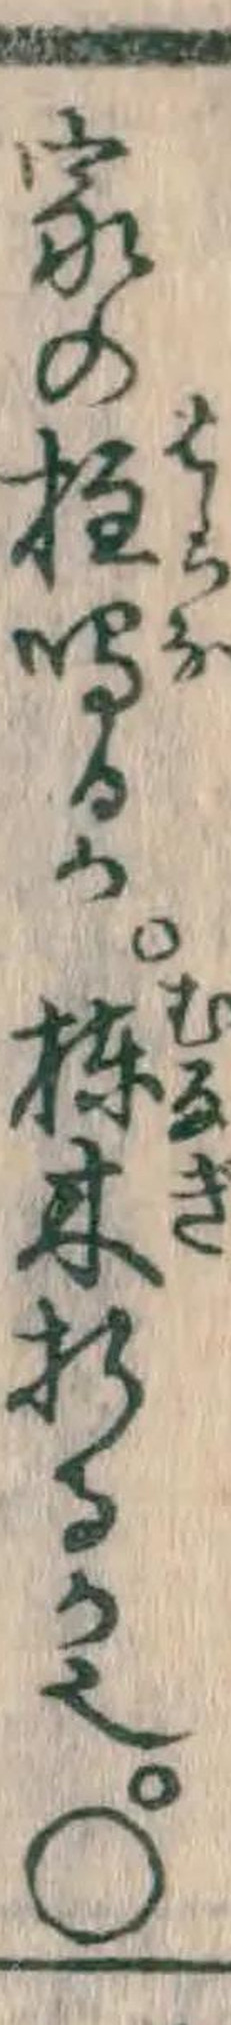家の柱鳴るか。棟木折るか也。○
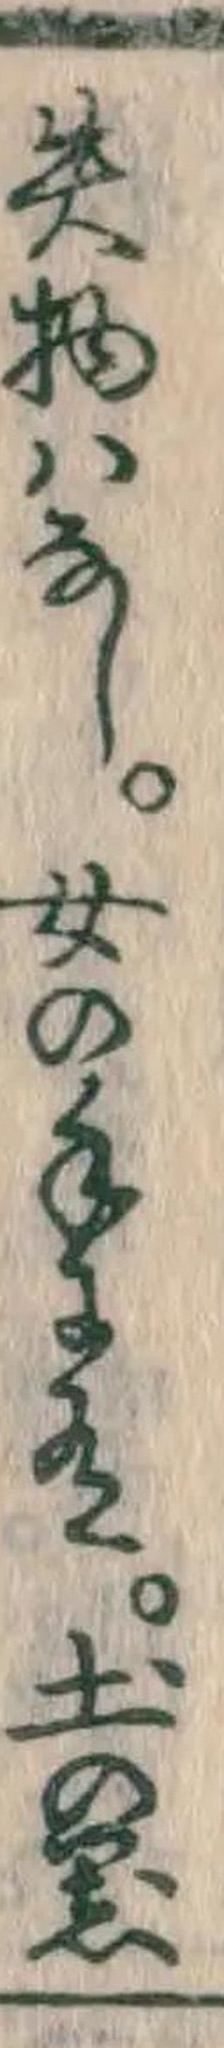失物はなし。女の手に有。土の器
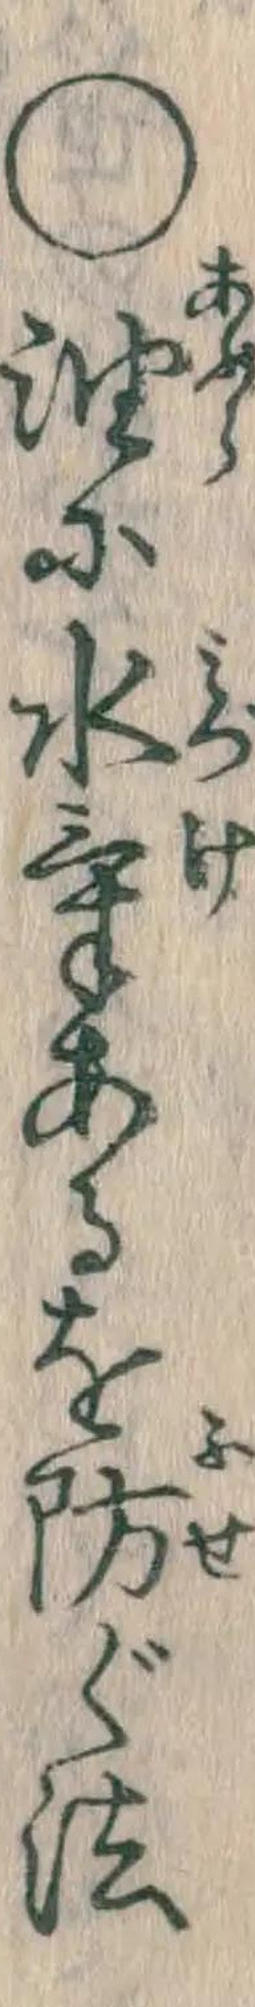○油に水気あるを防ぐ法
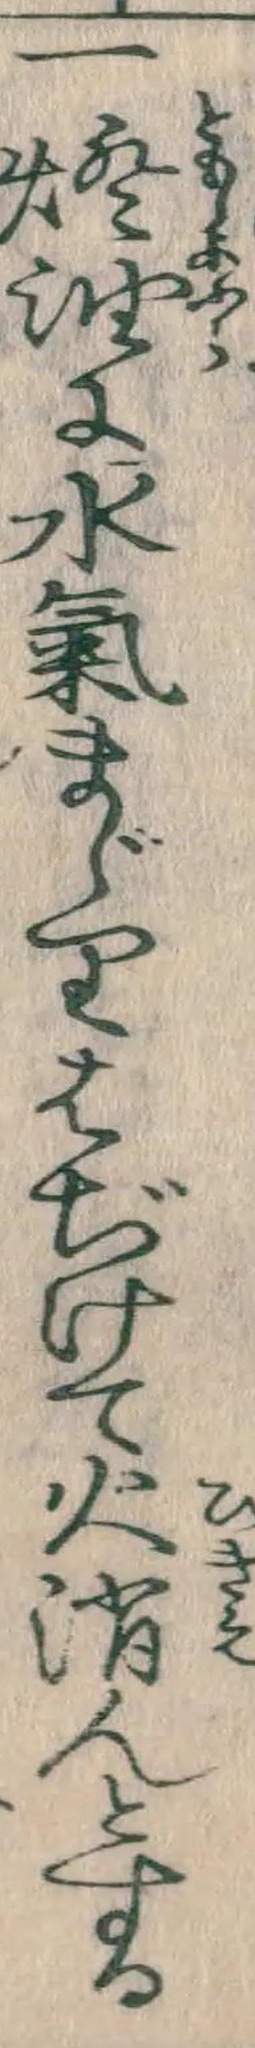一燈油に水気まじりはぢけて火消んとする
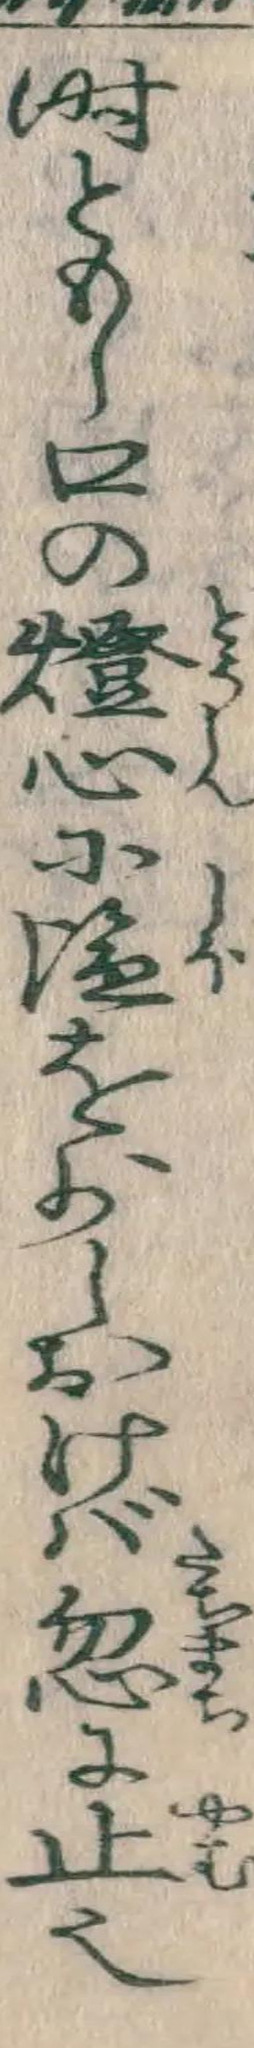時ともし口の燈心に塩を少しおけば忽に止也
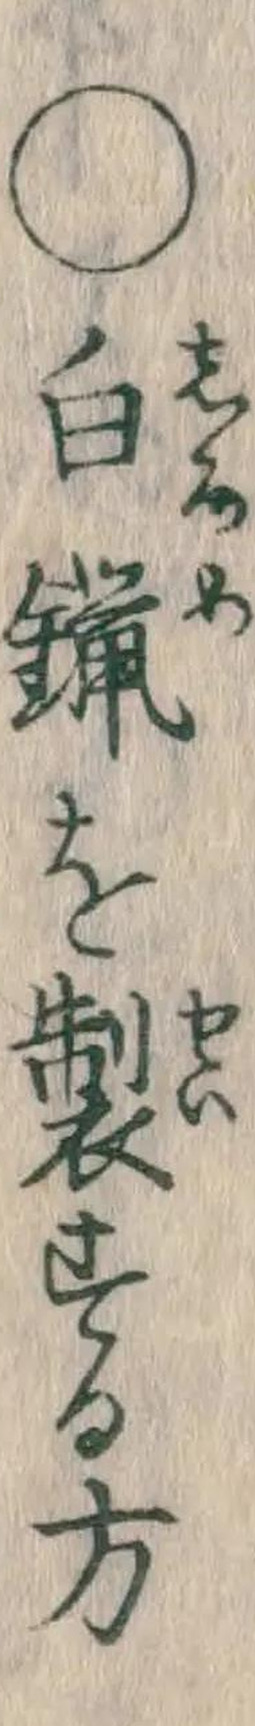○白鑞を製する方
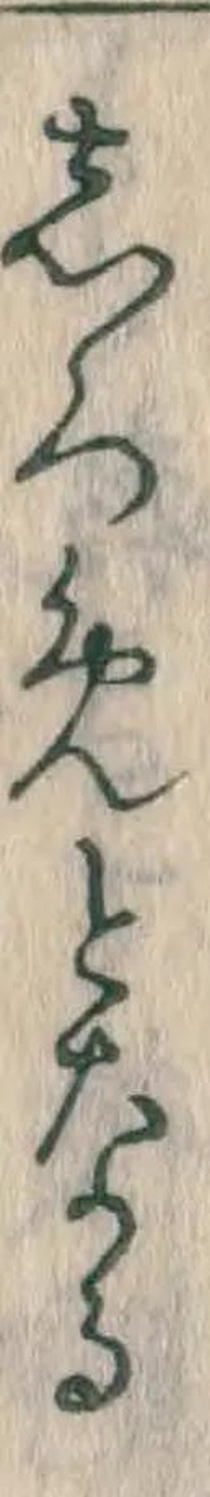しろめとなる
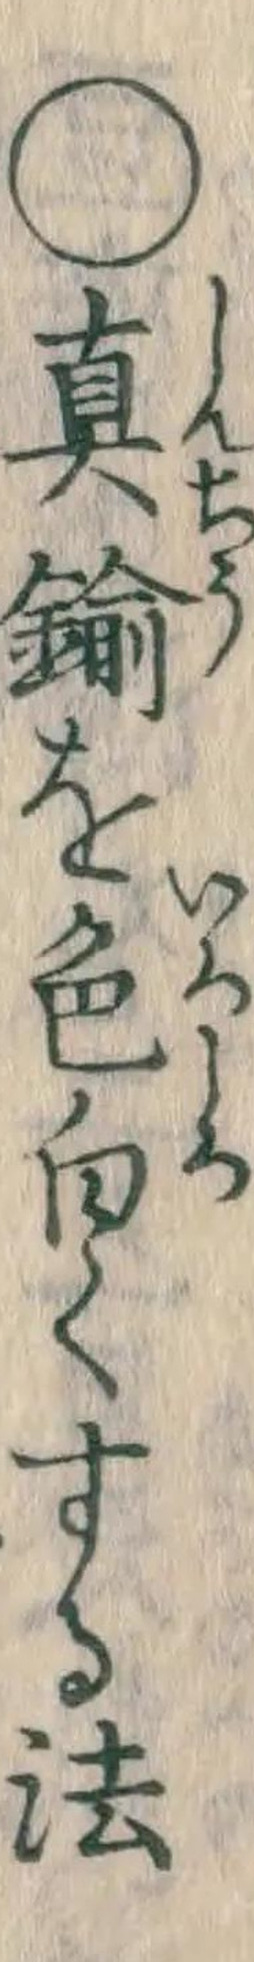○真鍮を色白くする法
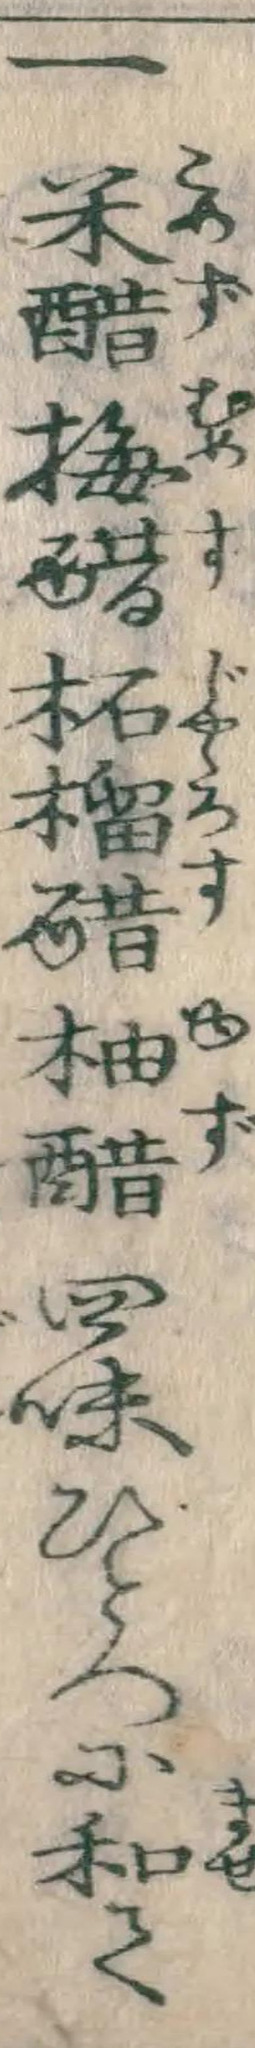一米醋梅醋拓榴醋柚醋四味ひとつに和て
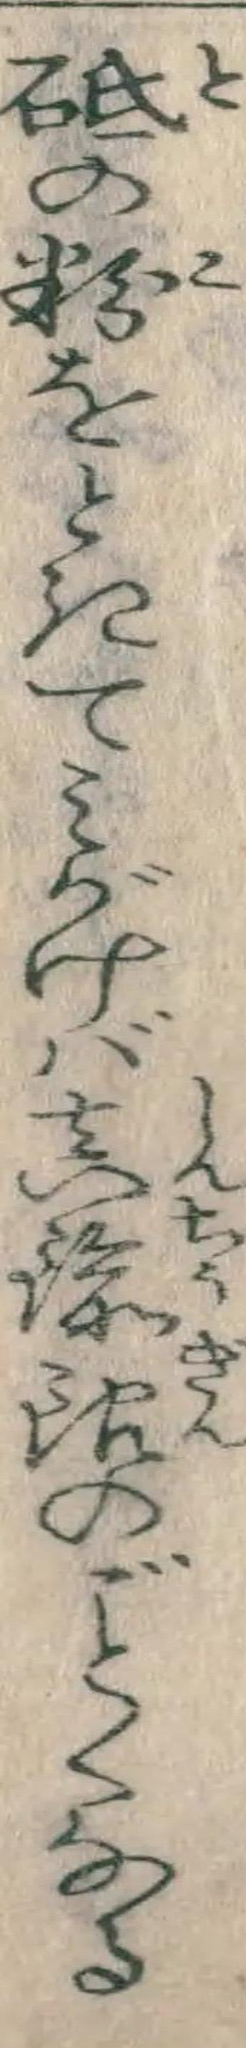砥の粉をときてみがけば真鍮銀のごとくなる
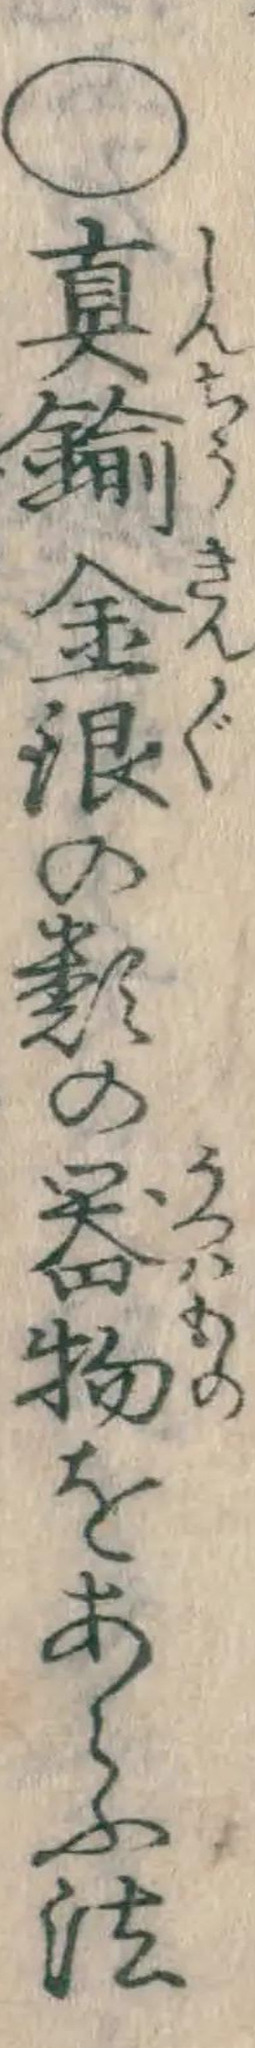○真鍮金銀の類の器物をあらふ法
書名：広益秘事大全 3巻. [1]
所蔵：国立国会図書館 National Diet Library, JAPAN
